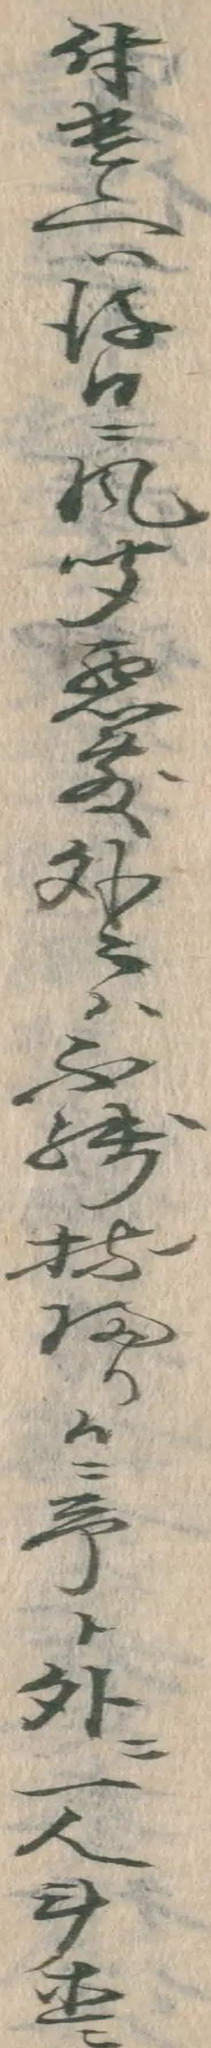付遣候へハ後日ニ風聞悪敷外ニハ不残持帰リ候ニ予ト外ニ一人ヲ直ニ
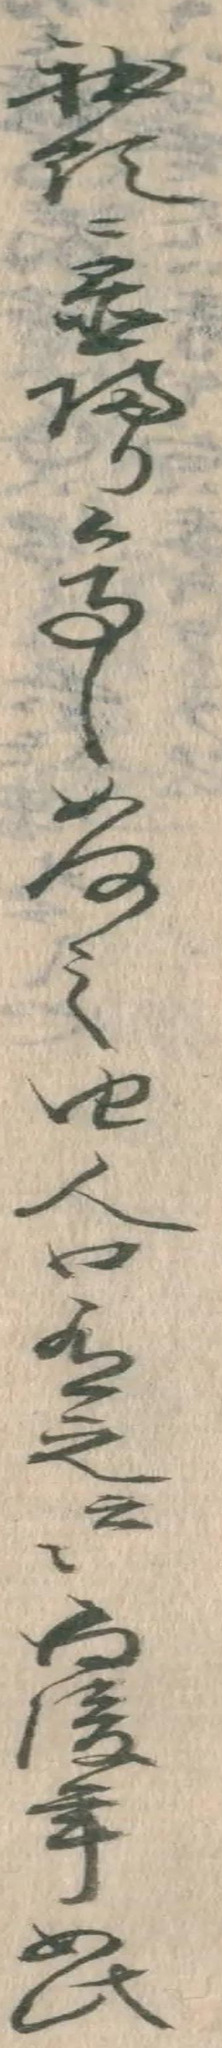社頭ニ置帰リ候事如何之由人口有之云々為後年如此
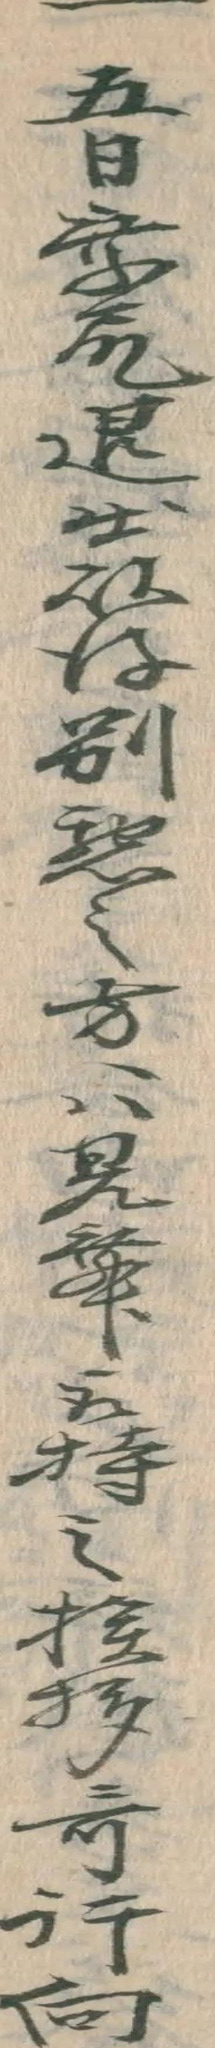一五日乗尻退出以後別懇之方へハ見舞取持之挨拶ニ可行向
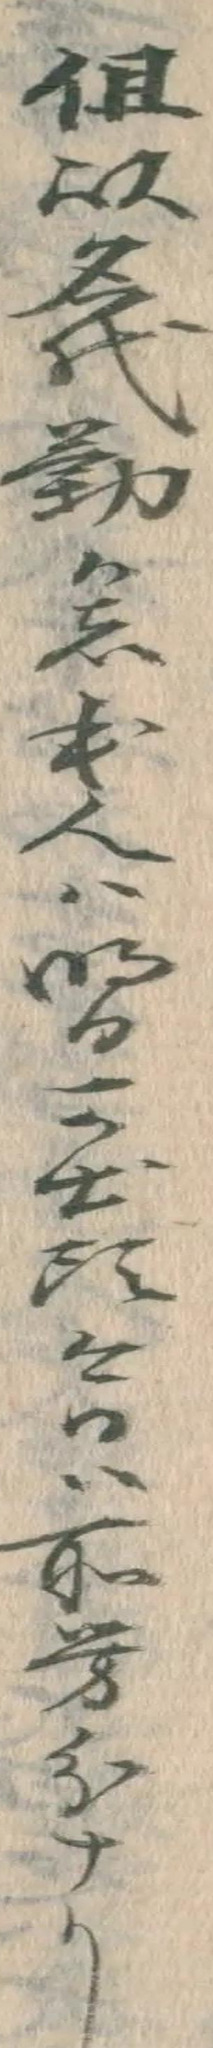但以名代勤候者本人ハ明日可出頭今日ハ所労分ナリ
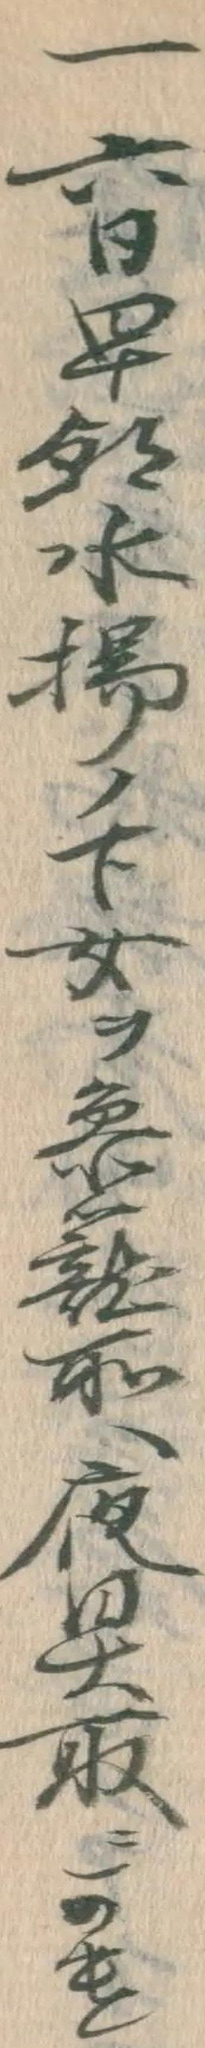一六日早朝水揚ノ下女ヲ参籠所へ夜具取ニ可遣
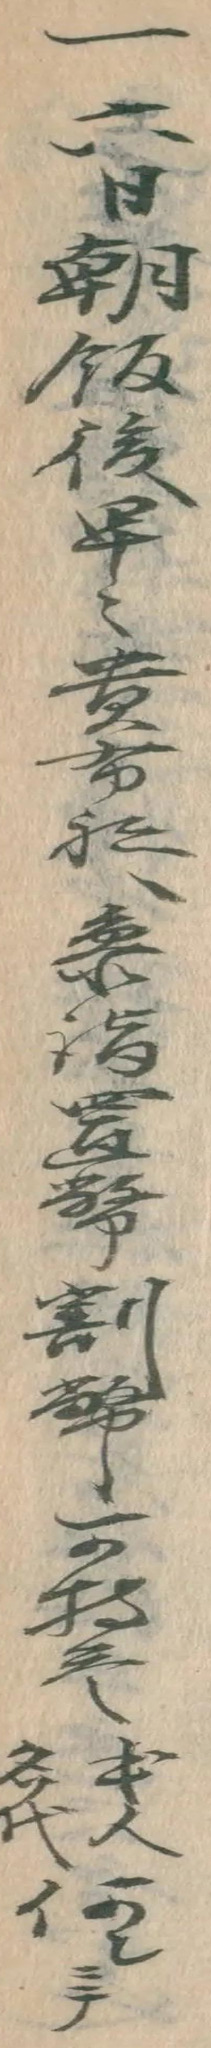一六日朝飯後早々貴布社へ参詣置幣割幣可持参本人名代何レニテ

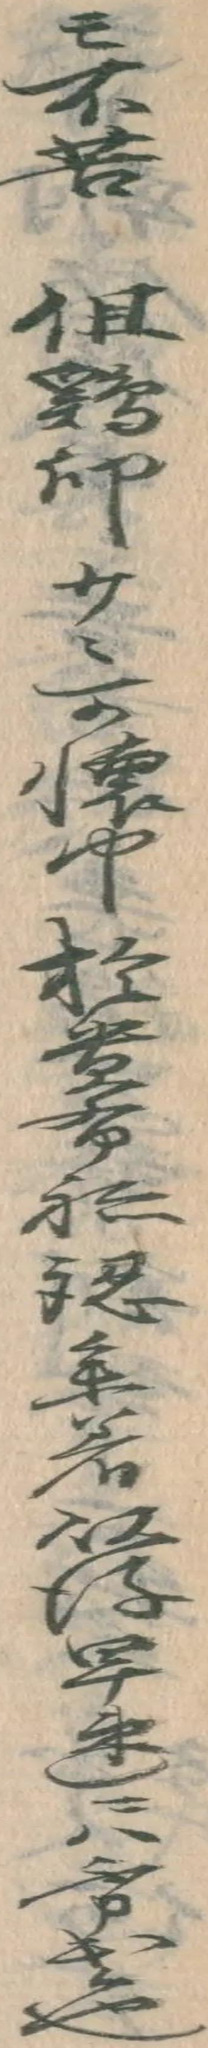モ不苦但鶏卵少々可懐中於貴布社認参着以後早速ニハ不申遣也
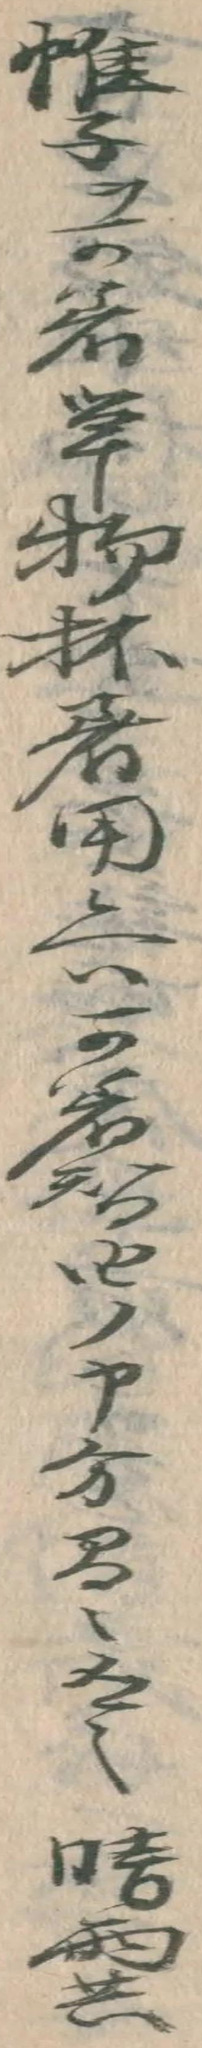帷子ヲ可着単物杯着用候へハ可着替由ノ申分間々有之晴雨共
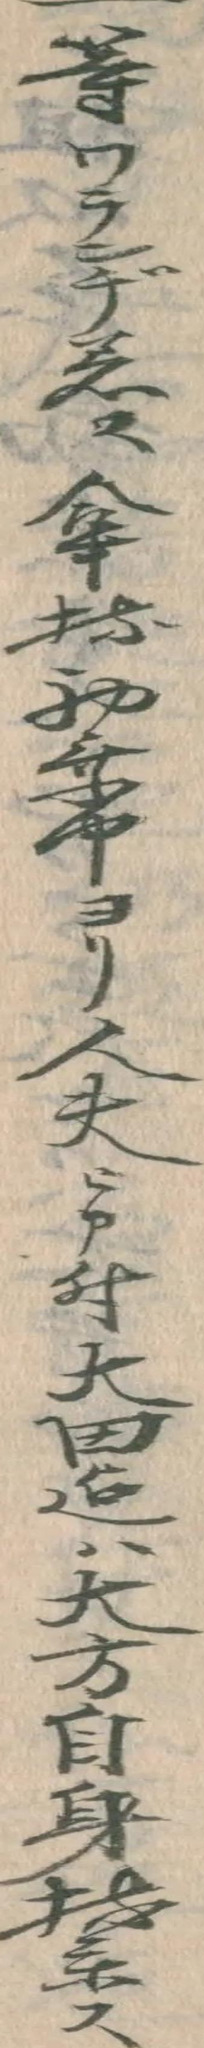一等ワランヂ着ス傘持初乗中ヨリ人夫被申付大田迄ハ大方自身持参ス
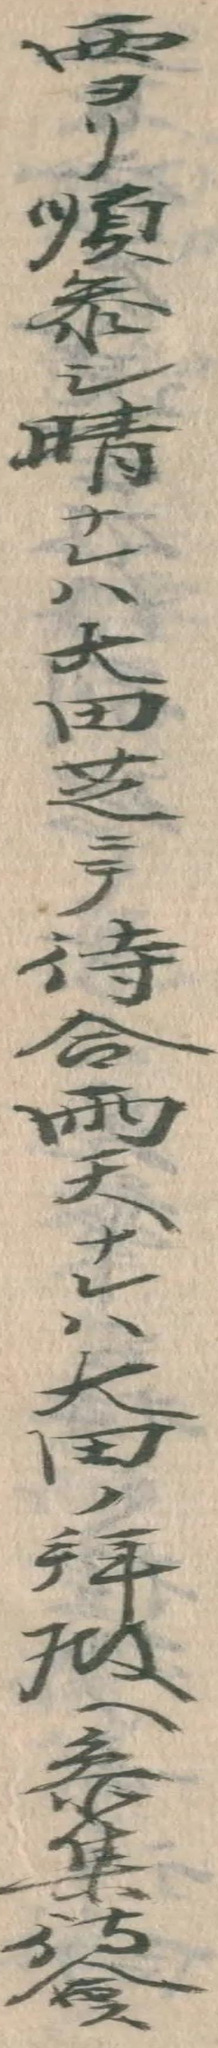西ヨリ順参シ晴ナレハ大田芝ニテ待合雨天ナレハ大田ノ拝殿へ参集待合ス
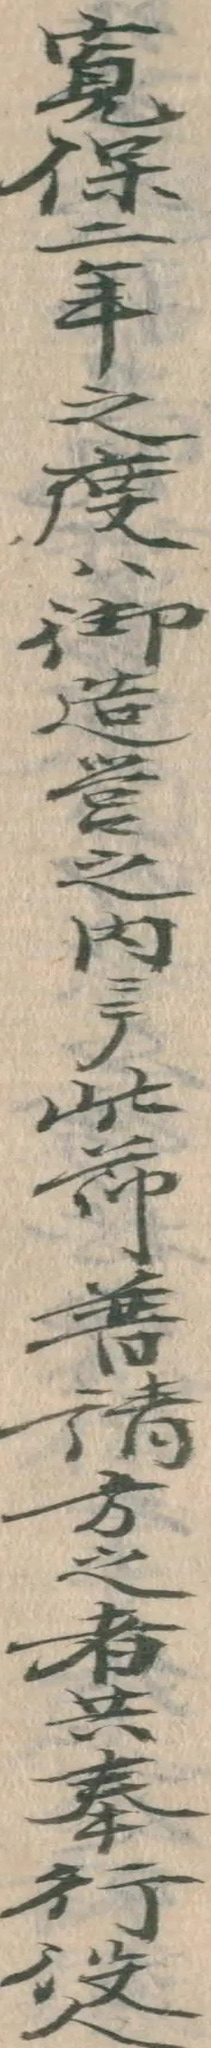寛保二年之度ハ御造営之内ニテ此節普請方之者共奉行役人
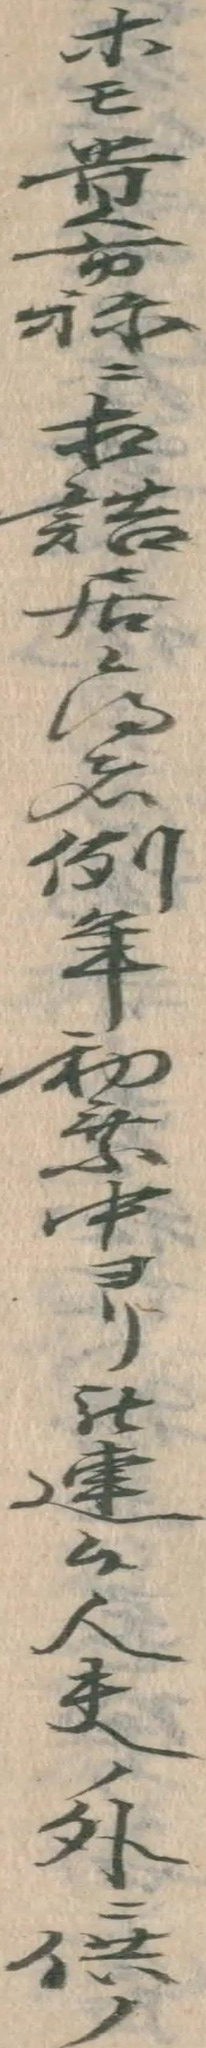等モ貴布禰ニ相詰居候得者例年初乗中ヨリ被連候人夫ノ外ニ供ノ
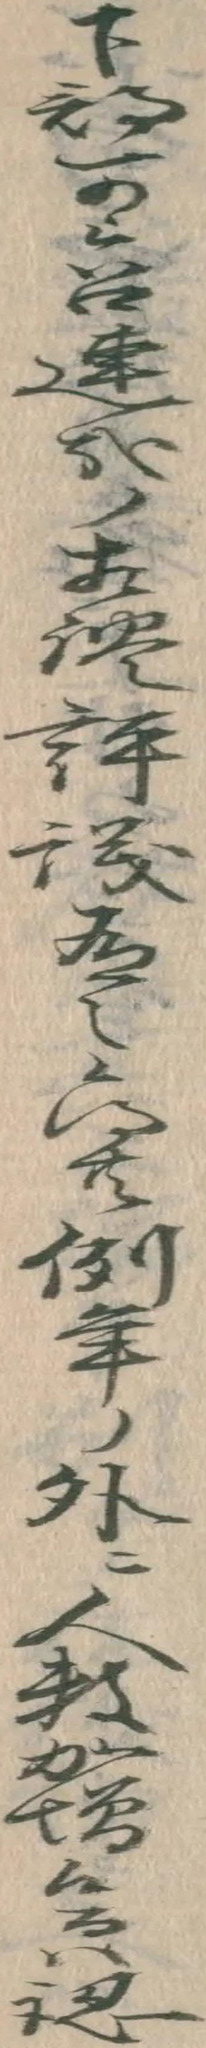下部可被召連哉ノ相談評議有之候得共例年ノ外ニ人数加増候而ハ認
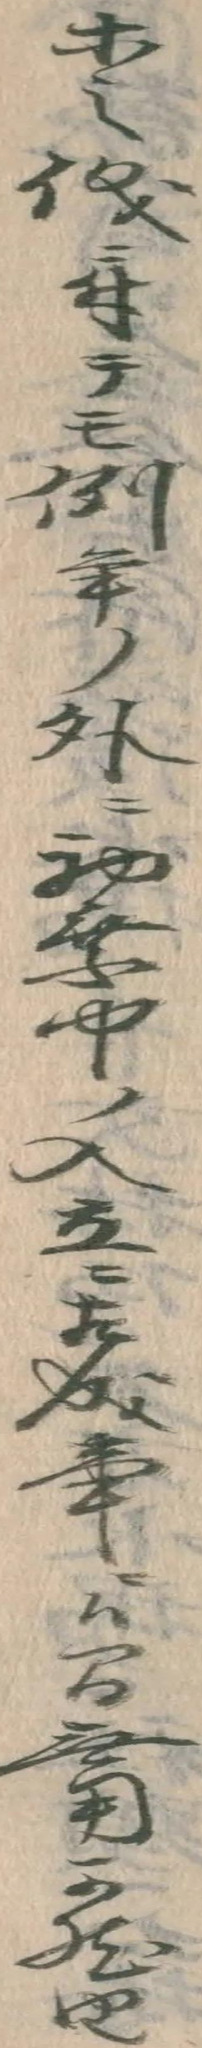等之儀ニ付テモ例年ノ外ニ初乗中ノ入立ニ相成事ニ候間無用可然由
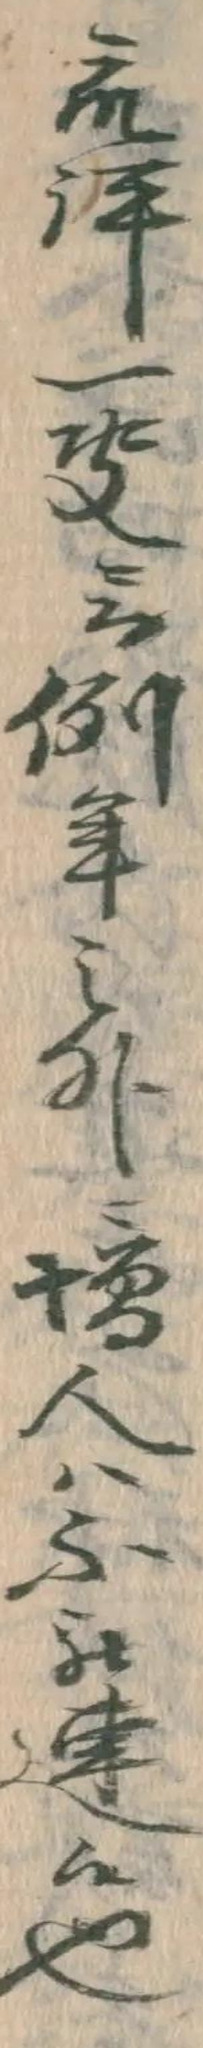衆評一決ニ而例年之外ニ増人ハ不被連候也
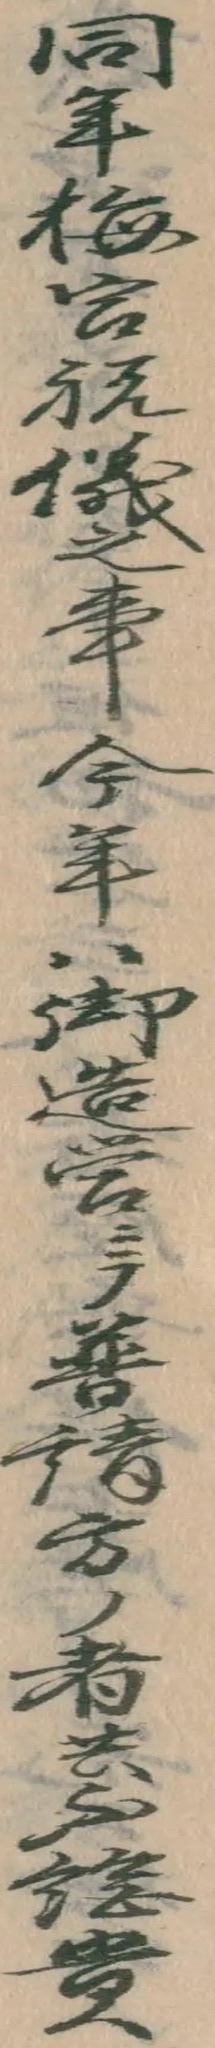同年梅宮祝儀之事今年ハ御造営ニテ普請方ノ者共不絶貴
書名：賀茂社記録. 第11冊
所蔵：国立国会図書館 National Diet Library, JAPAN
